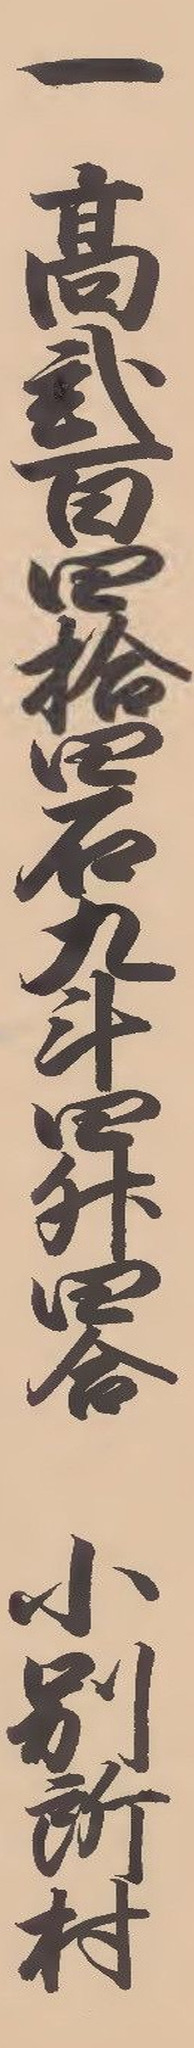一高弐百四拾四石九斗四升四合小別所村
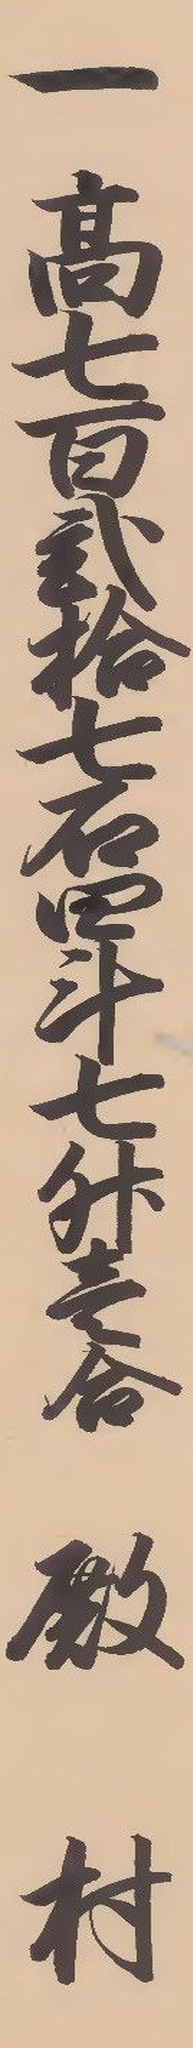一高七百弐拾七石四斗七升壱合殿村
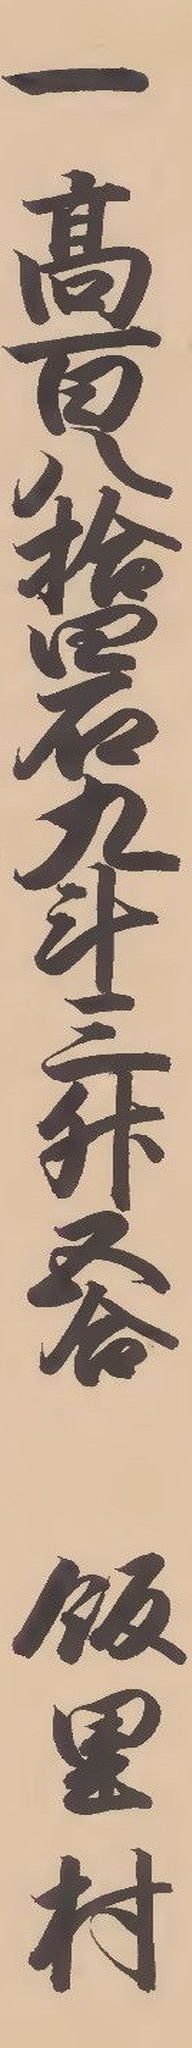一高百八拾四石九斗三升五合飯里村
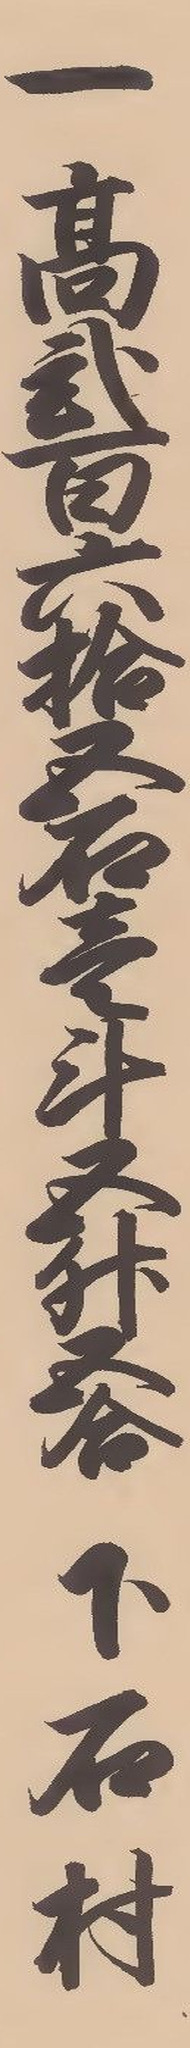一高弐百六拾五石壱斗五升五合下石村

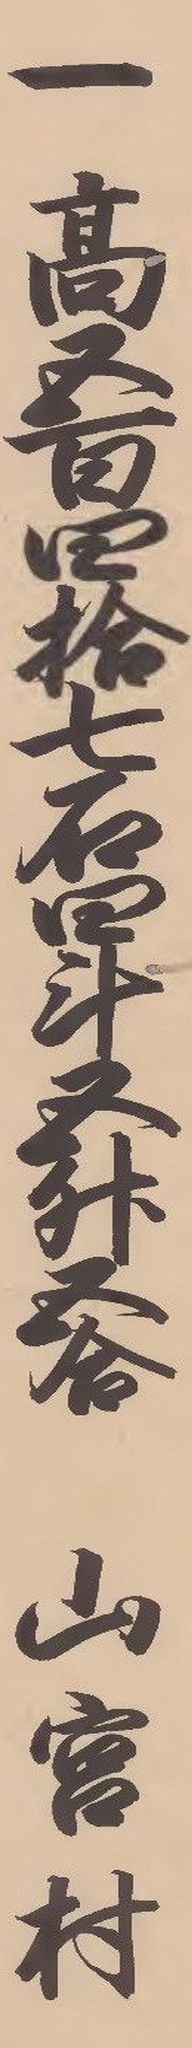一高五百四拾七石四斗五升五合山宮村
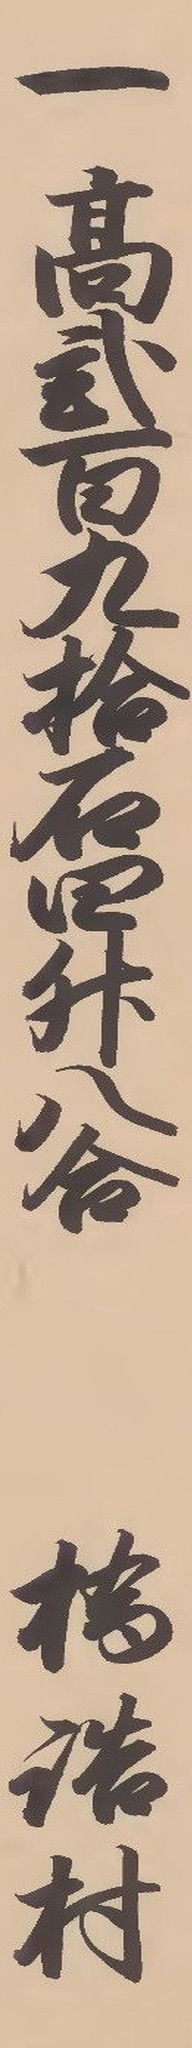一高弐百九拾石四升八合橋詰村
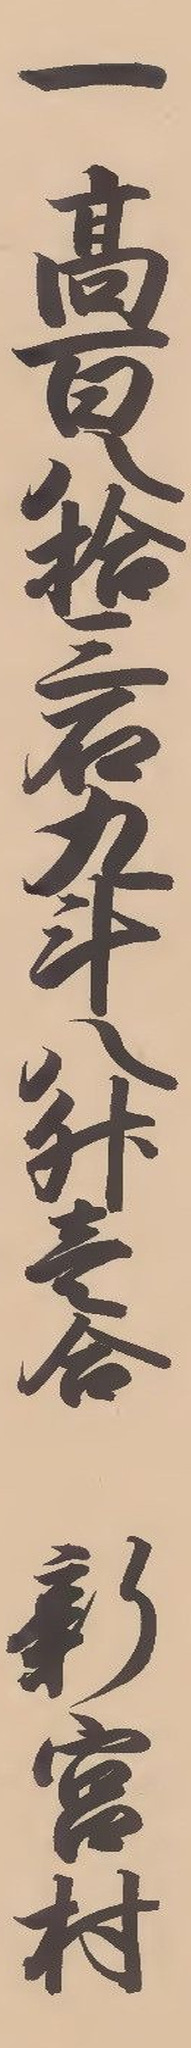一高百八拾三石九斗八升壱合新宮村
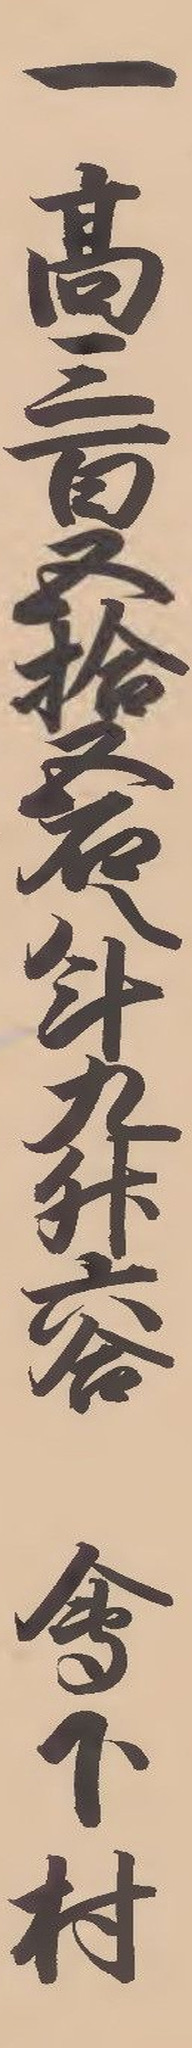一高三百五拾五石八斗九升六合会下村
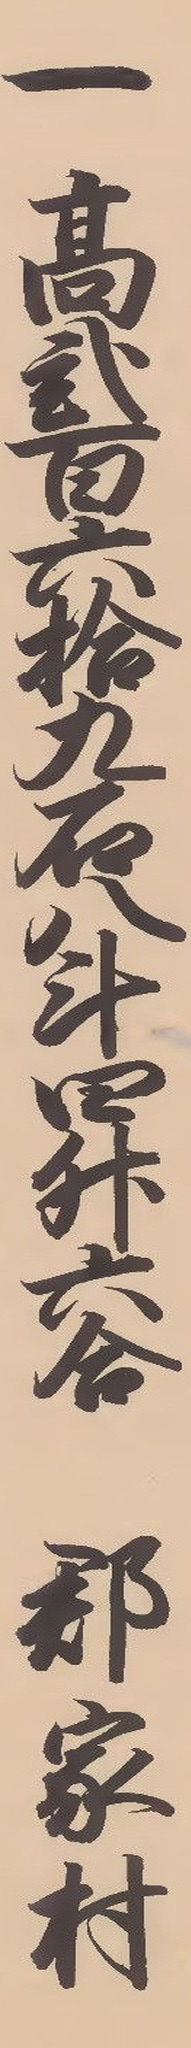一高弐百六拾九石八斗四升六合郡家村
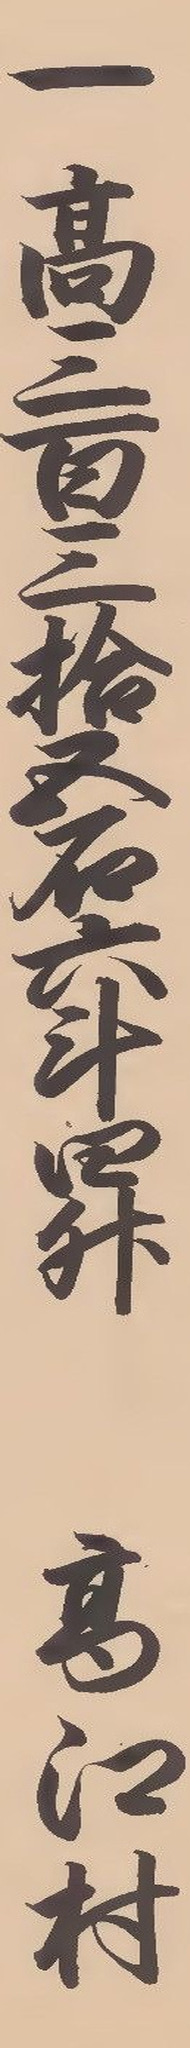一高三百三拾五石六斗四升高江村
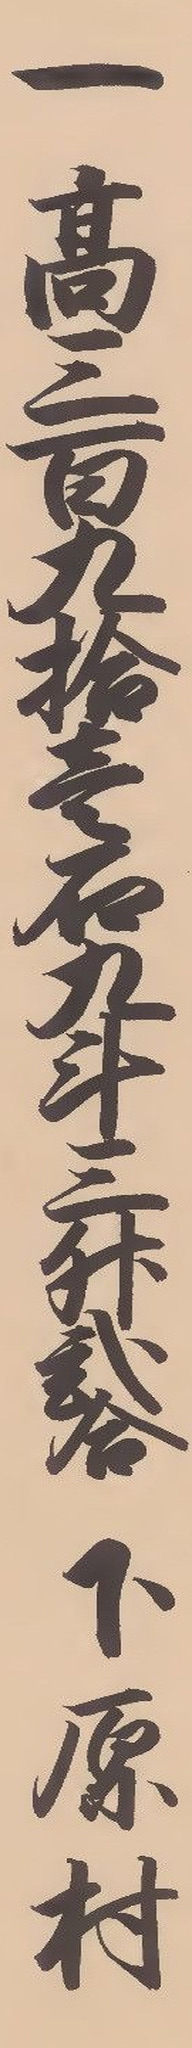一高三百九拾壱石九斗三升弐合下原村
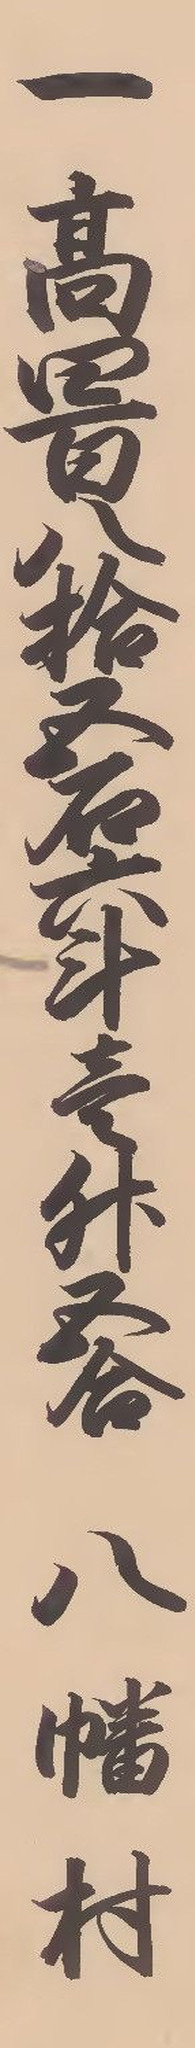一高四百八拾五石六斗壱升五合八幡村

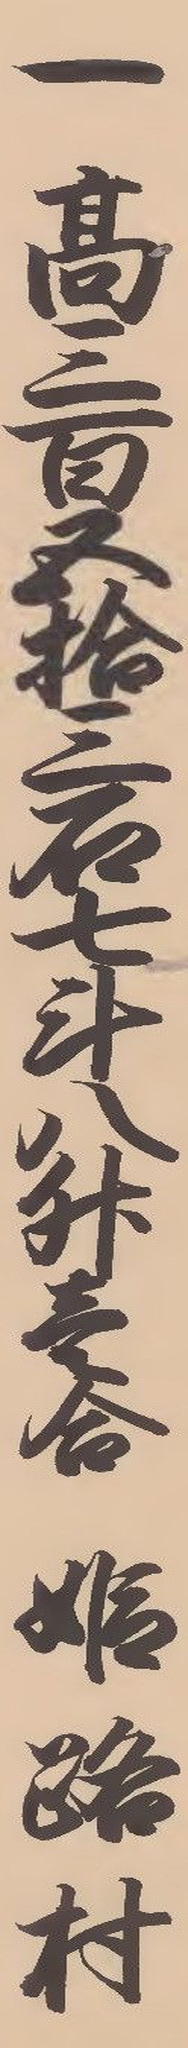一高三百五拾三石七斗八升壱合姫路村
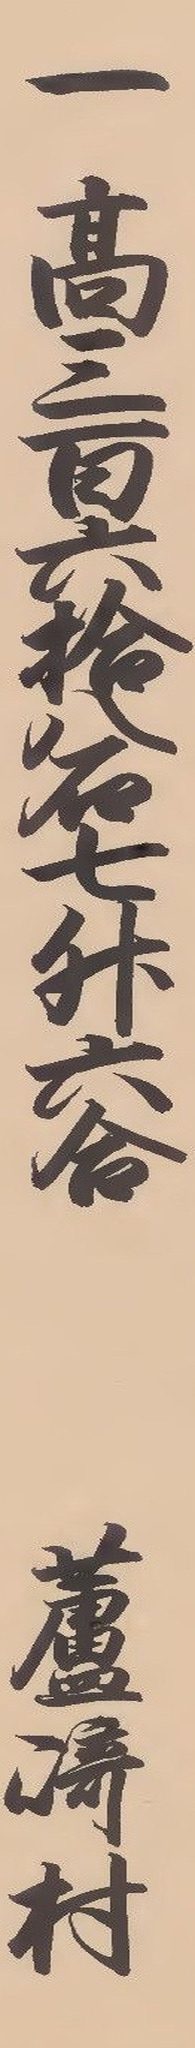一高三百六拾八石七升六合蘆崎村
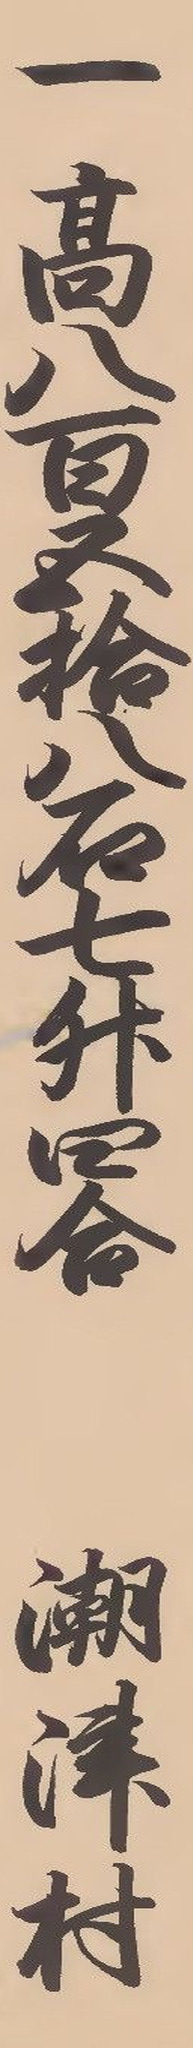一高八百五拾八石七升四合潮津村
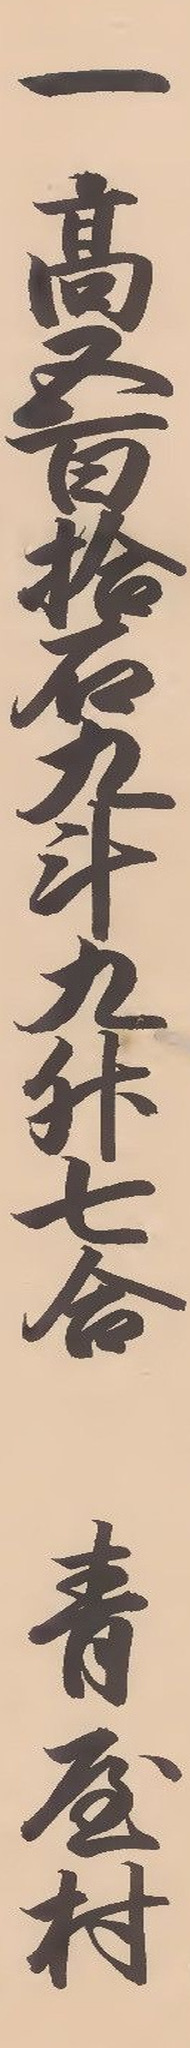一高五百拾石九斗九升七合青屋村
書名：因幡国郷帳
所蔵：国立公文書館 National Archives of Japan
